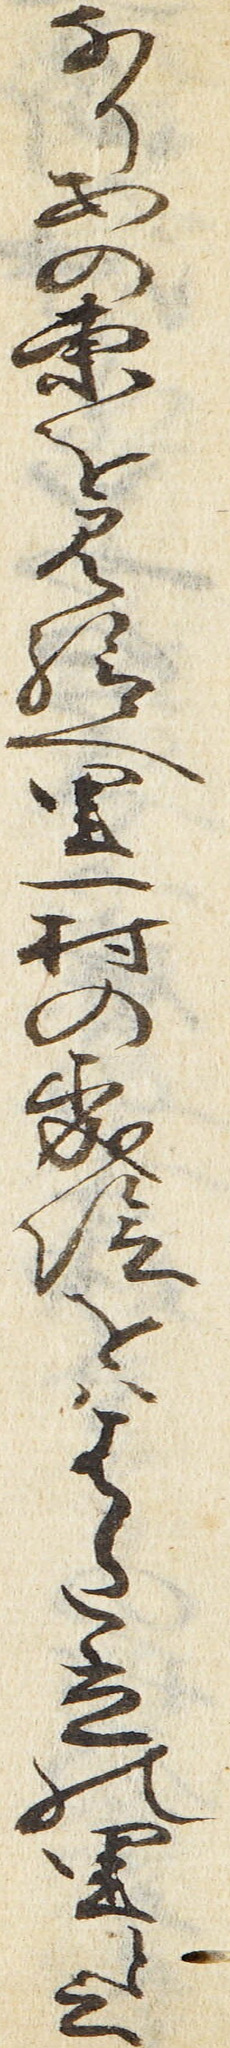なりあの東を見給へ里一村の森陰をははた立の里と云
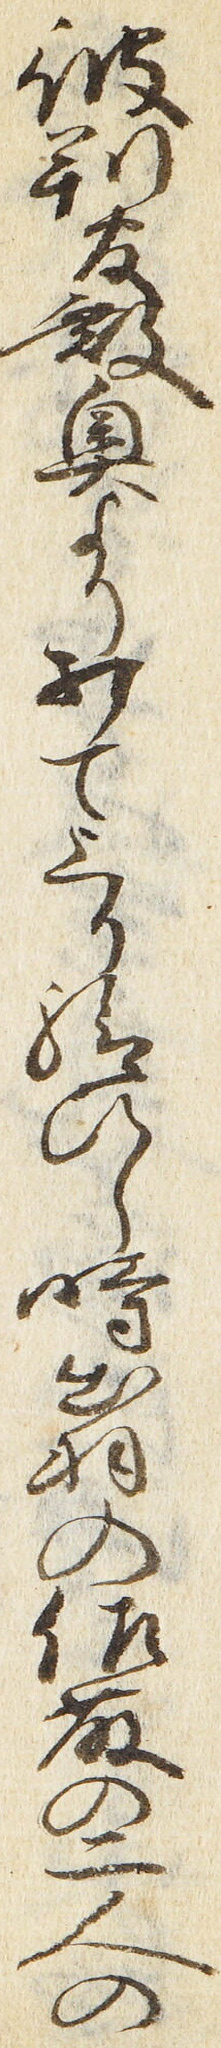彼判官殿奥より打て上り給ひし時出羽の佐藤の二人の
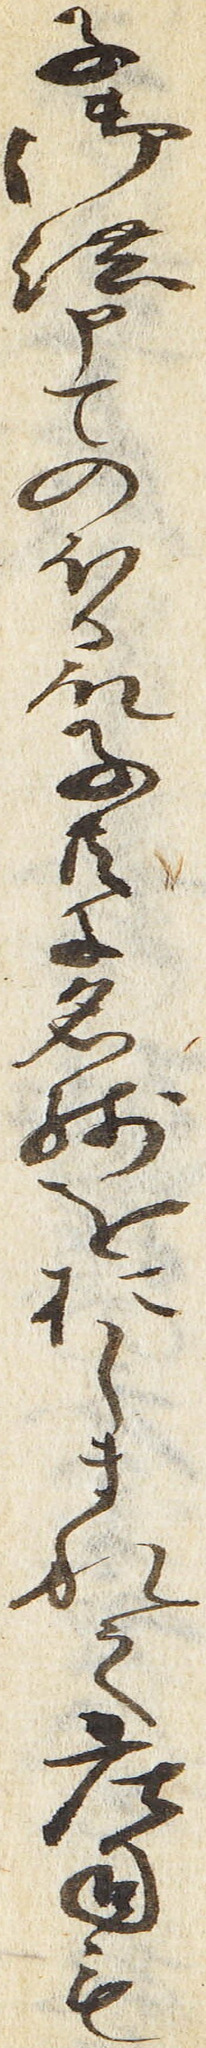子御供申てのほる故子共に名残をおしまれて庄司も
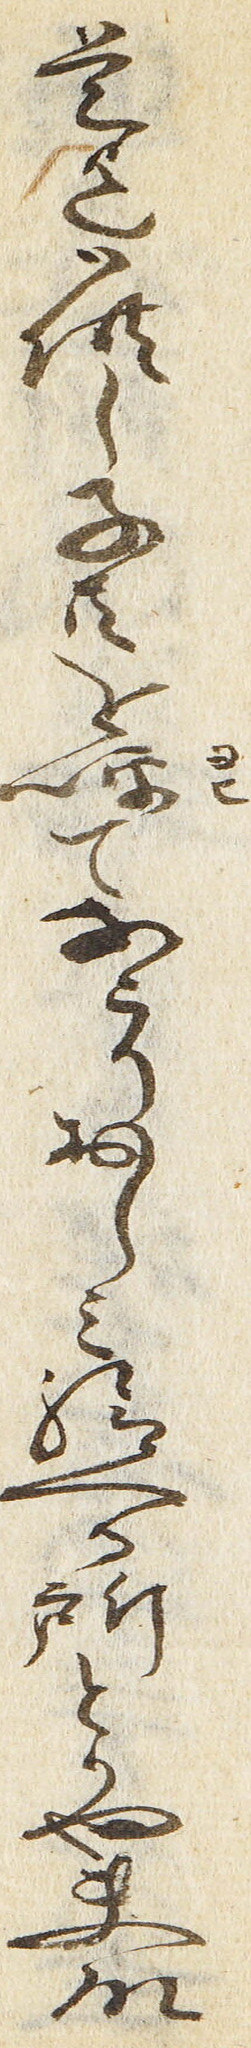是迄御供し子共を呼てなこりおしみ給へる所とかや夫故
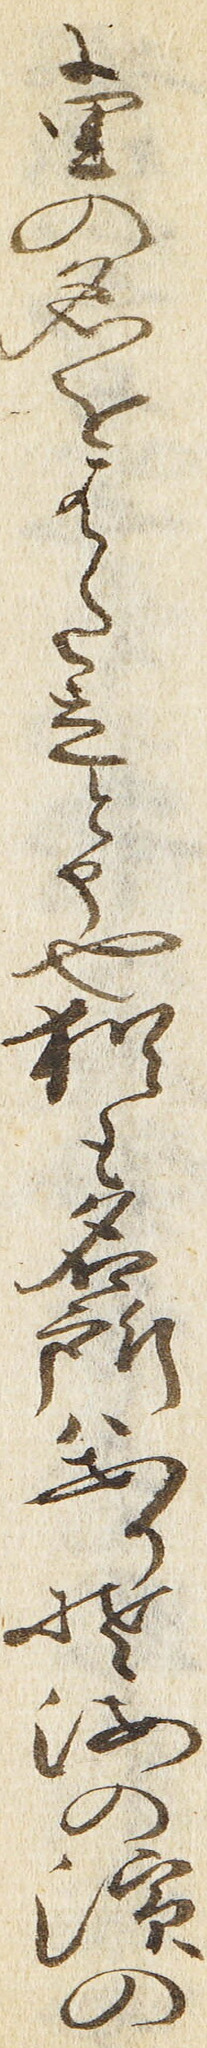に里の名をはた立と申也猶も名所はありそ海の浜の
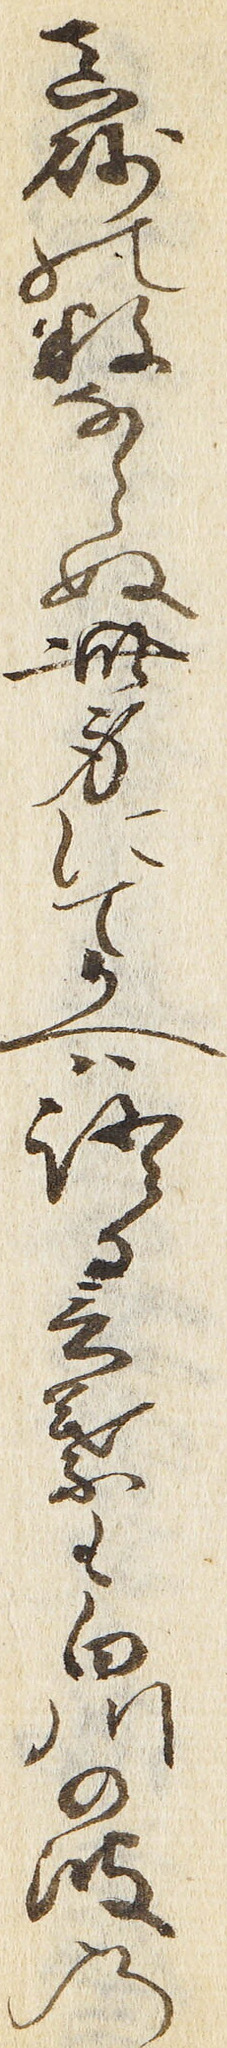真砂の数ならぬ此身にて候へは語る言葉も白川の波の
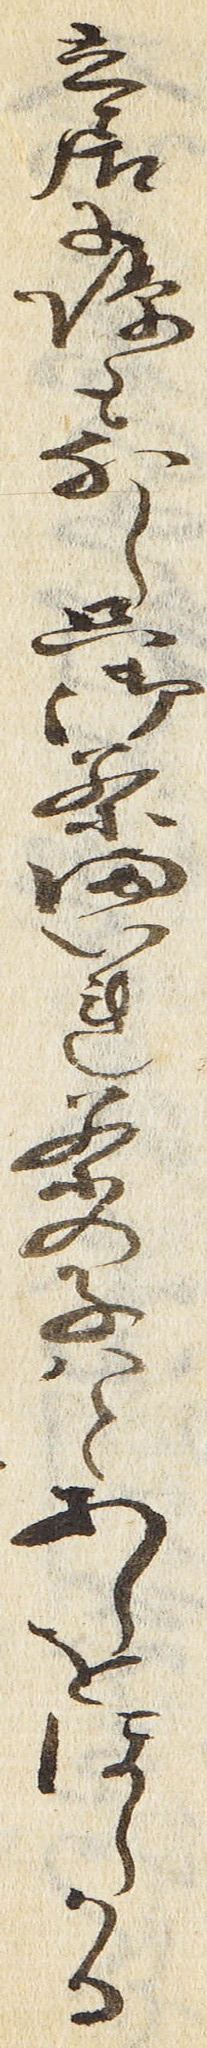立居に隙もなし只御茶まいれ茶の子はとあしをほしかる
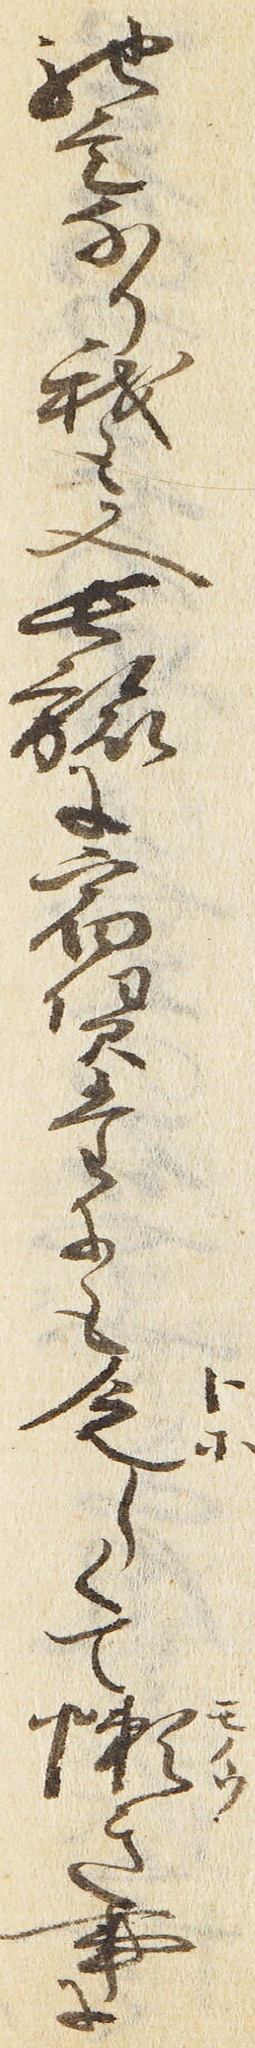馳走なり我も又長旅に宿賃たにも乏しくて懶き事に
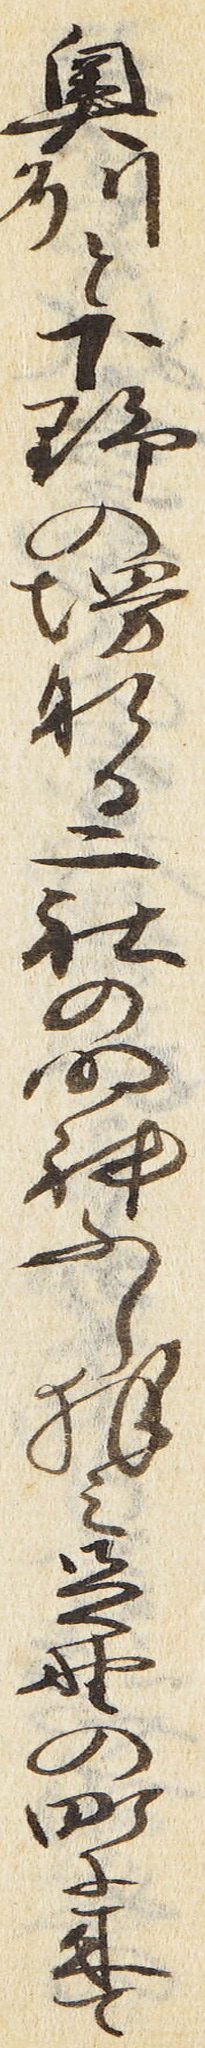奥州と下野の堺なる二社の明神ふし拝み足野の町に来て
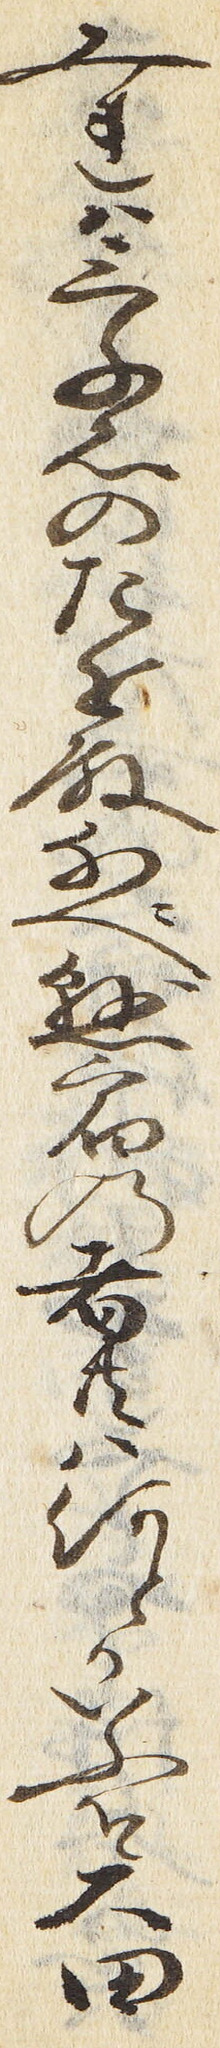みれは三千石の左近殿なべ懸宿の者共は何とかいふそ大田
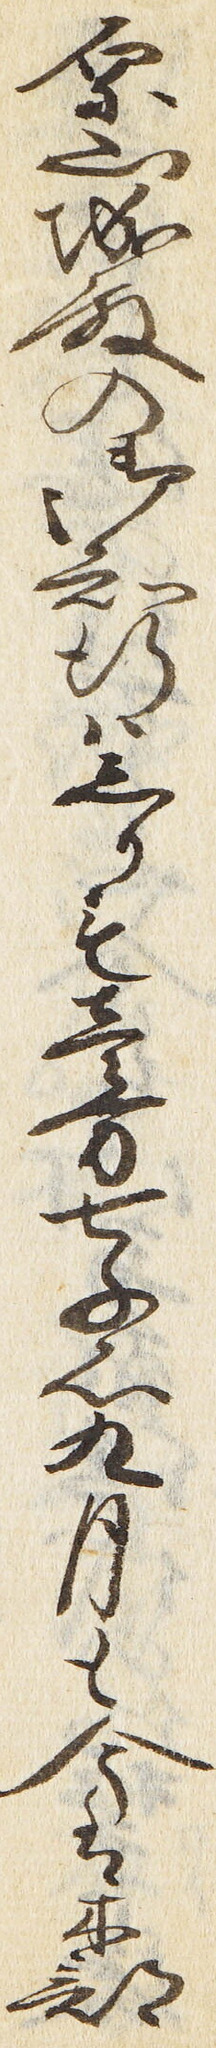原山城殿の御知行はしりも壱万七千石九月も今は木部
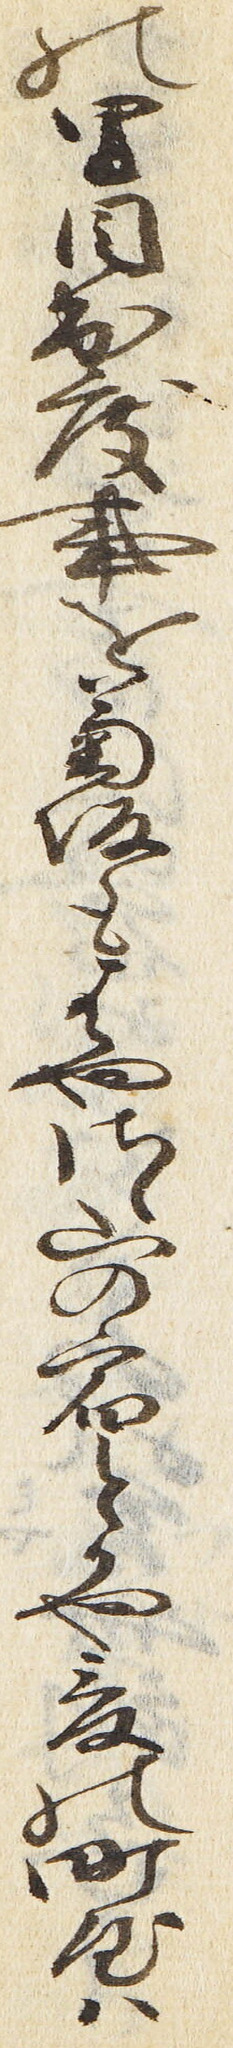の里目出度事を菊坂もはやさく山の宿とかや爰の町屋は
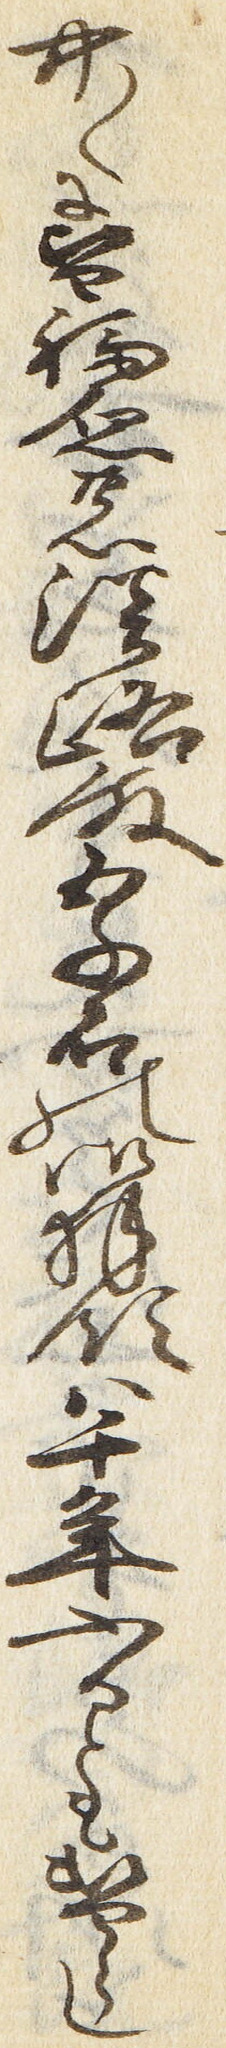中〳〵に皆福原の淡路殿五千石の御拝領は千年ふるとも替らし
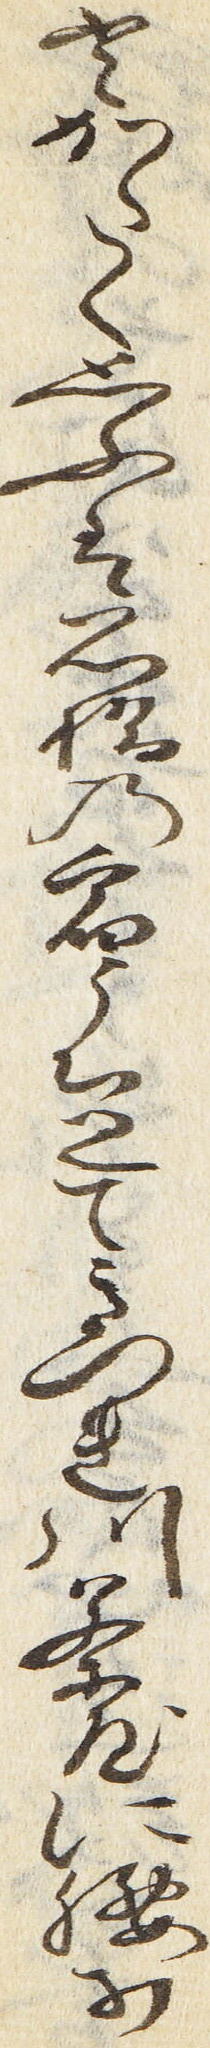とかたく思ふは石橋の宿うち過てきつれ川茶屋に腰打
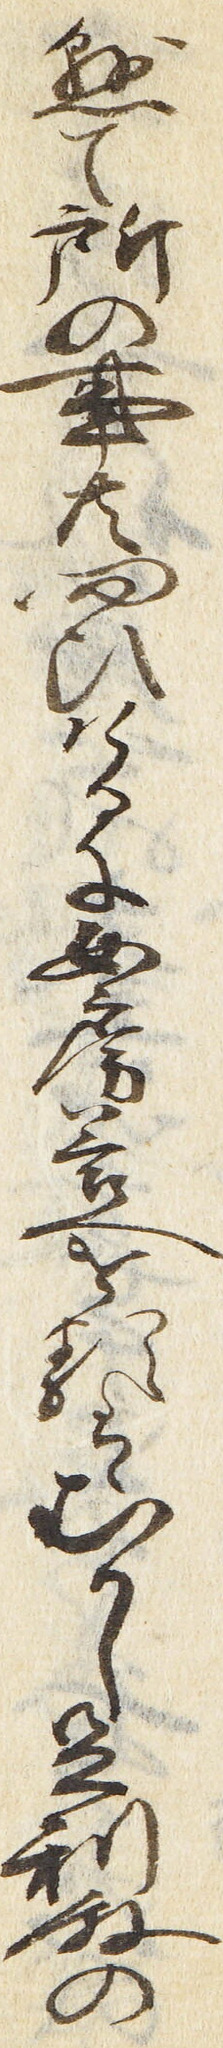懸て所の事共問ひけるに女房答へけるはむかし足利殿の
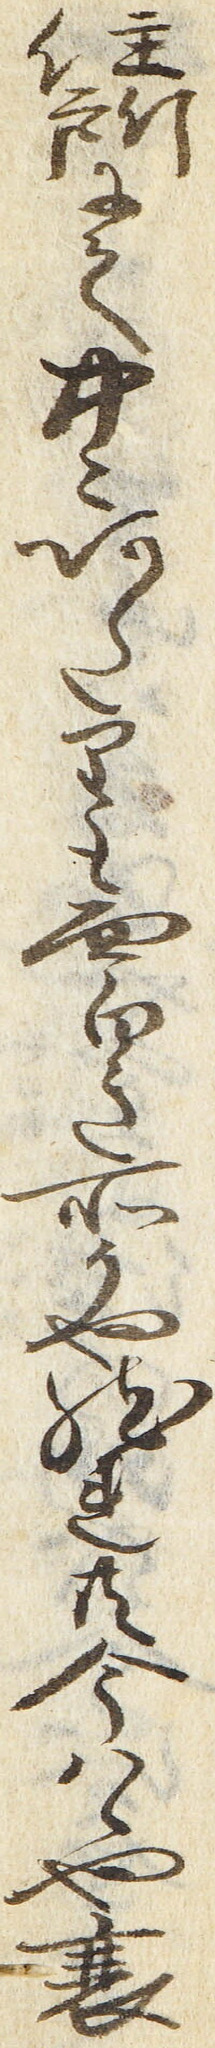住所にて中々あたりも面白き所かや然れ共今はゝや衰
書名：海陸世話日記
